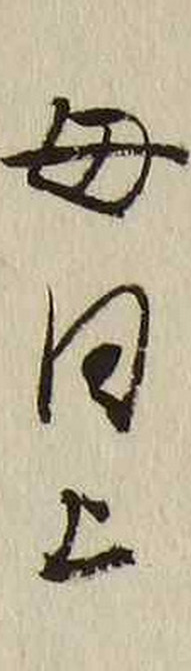母同上
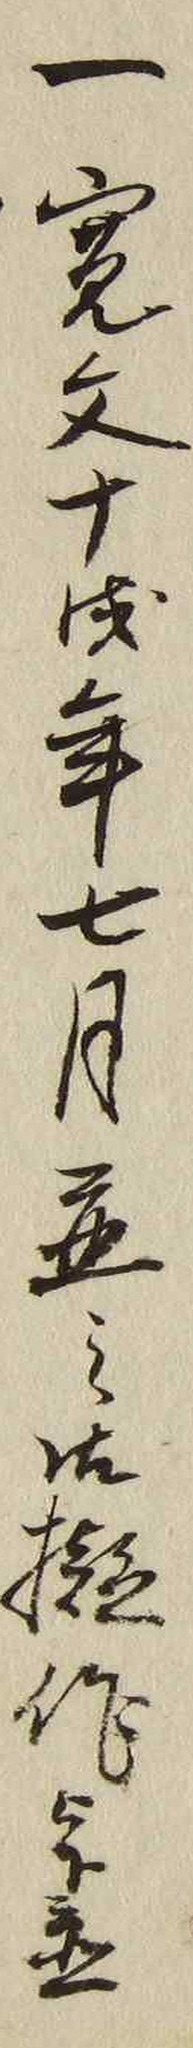一寛文十戌年七月並之御擬作被下置
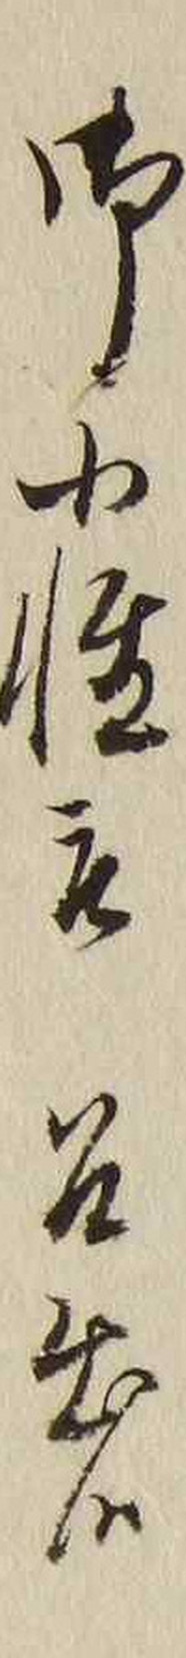御小性被召出候

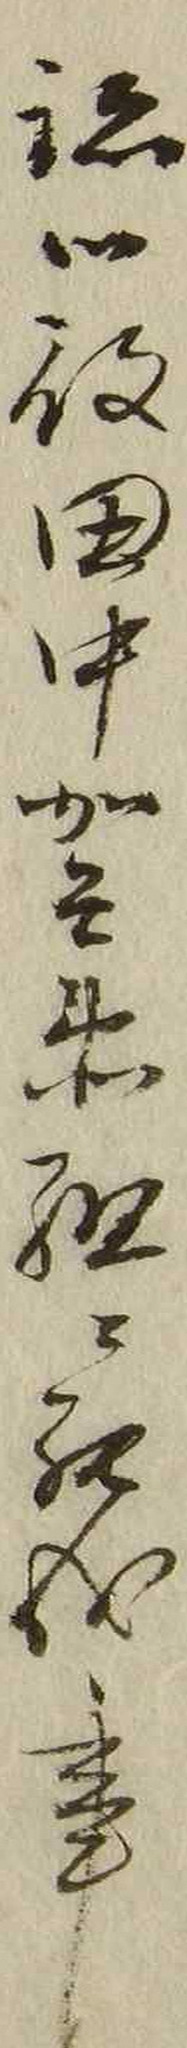跡御役田中加兵衛組ニ罷成候事
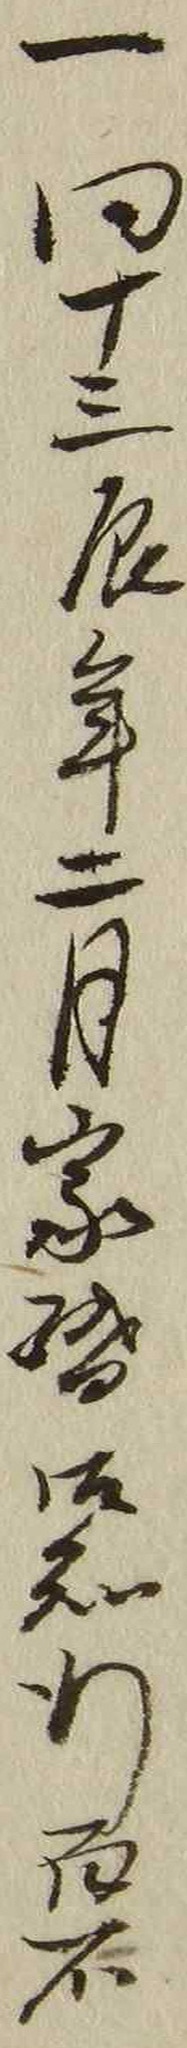一同十三辰年二月家督御知行百石
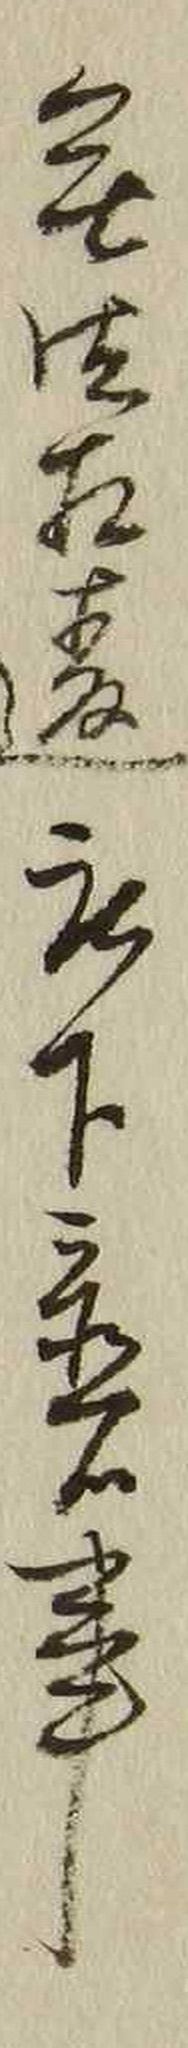無御相違被下置候事
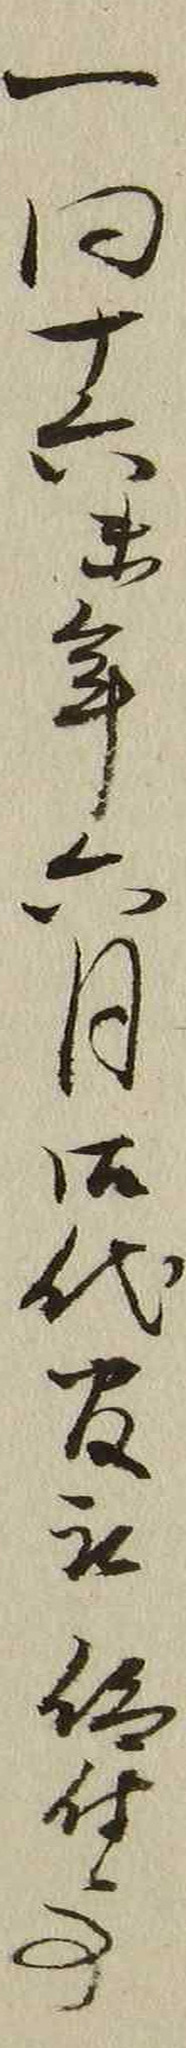一同十六未年六月御代官被仰付候事
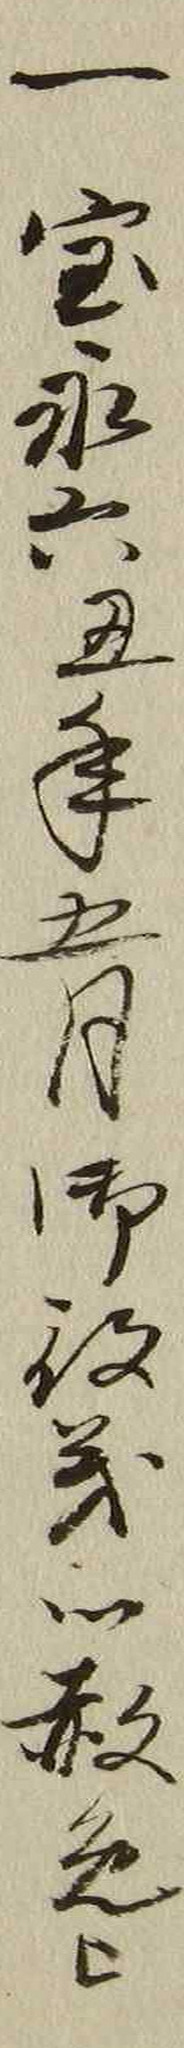一宝永六丑年五月御役義御赦免被
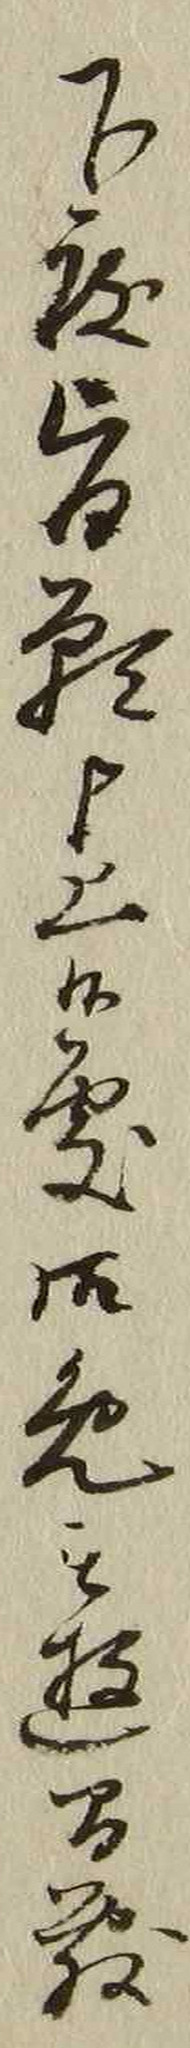下度旨願申上候処御免被遊間敷
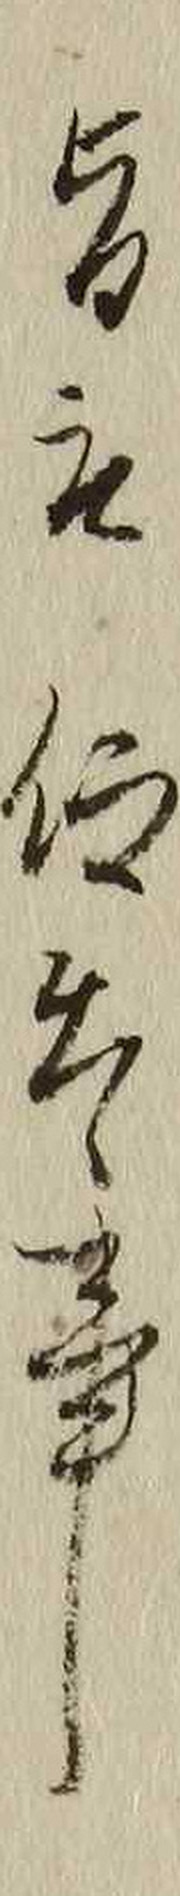旨被仰出候事
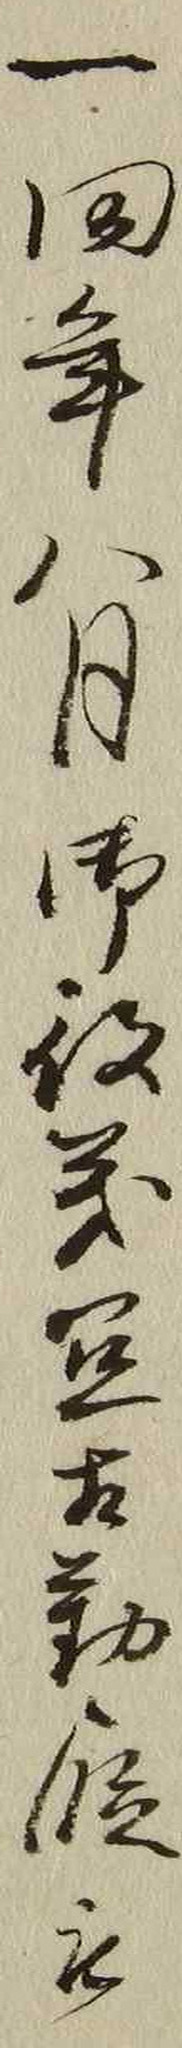一同年八月御役義宜相勤候段被
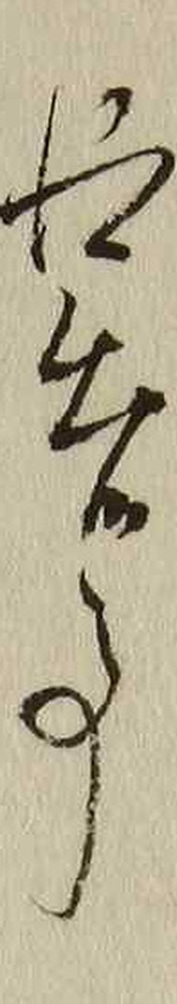仰出候事
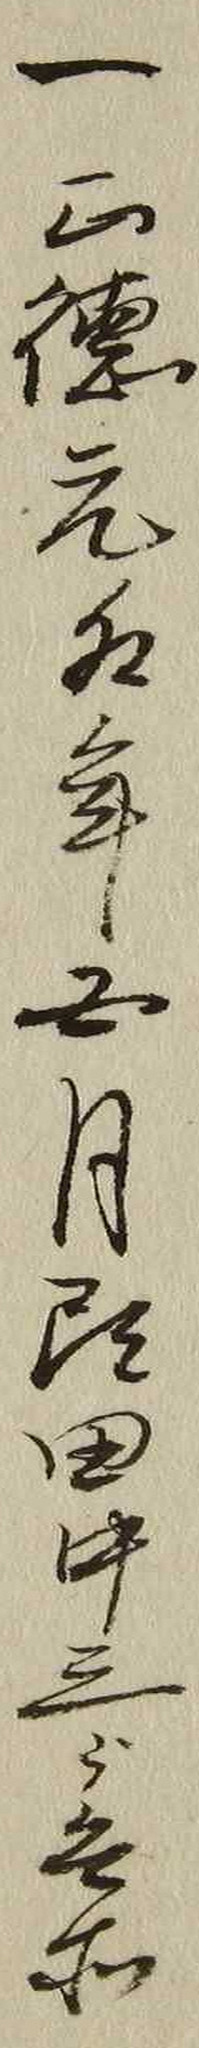一正徳元卯年五月頭田中三郎兵衛
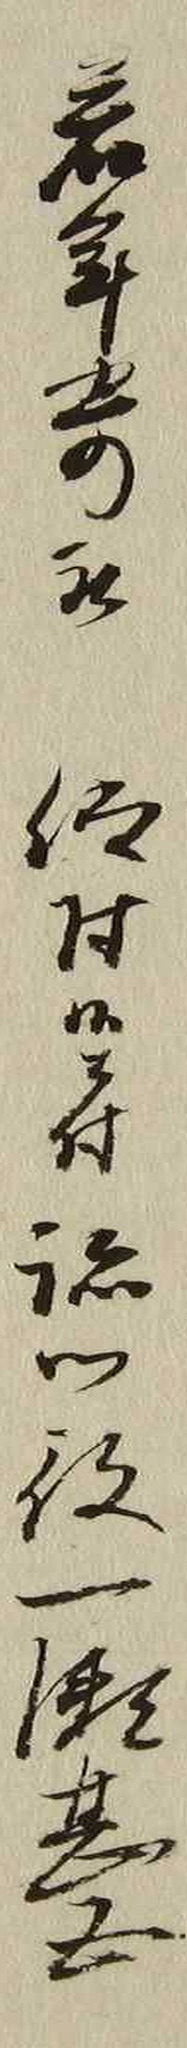若年寄被仰付候ニ付跡御役一瀬甚五
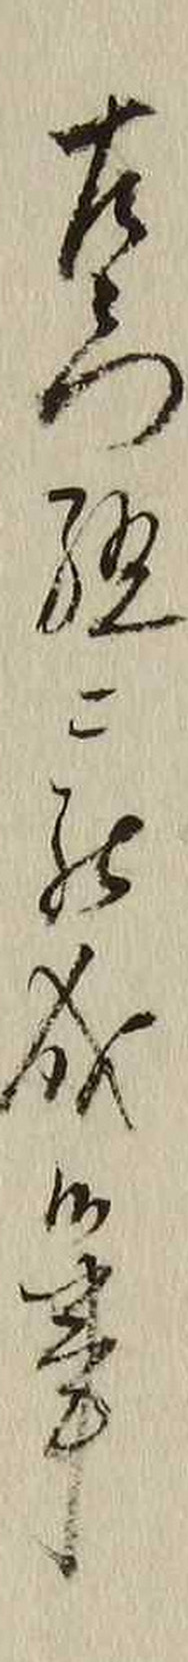左衛門組ニ罷成候事
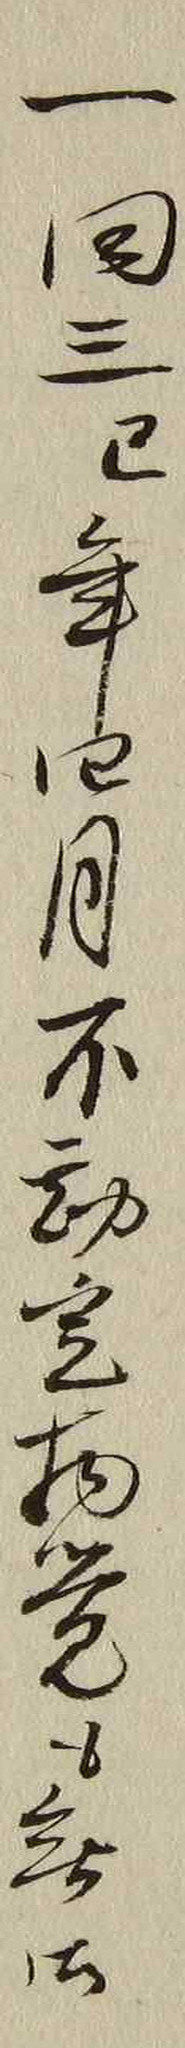一同三巳年四月不勘定物覚も無御
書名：諸士系譜　巻之359　す之部9
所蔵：会津若松市立会津図書館
